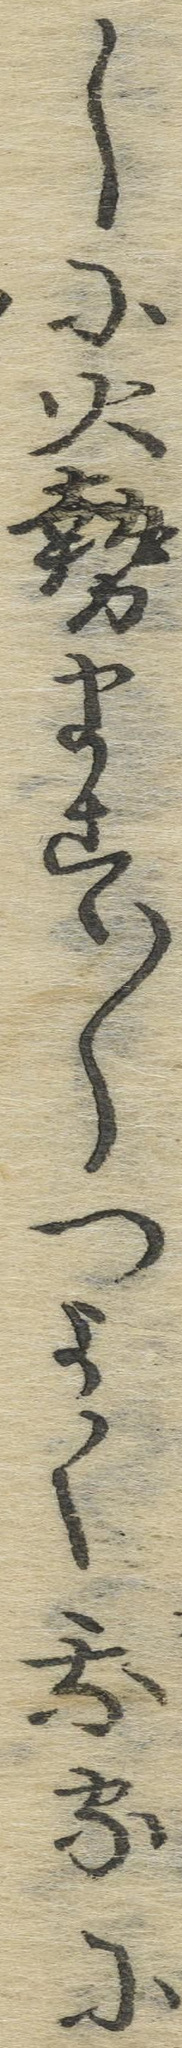しに火勢ます〳〵つよく我家に
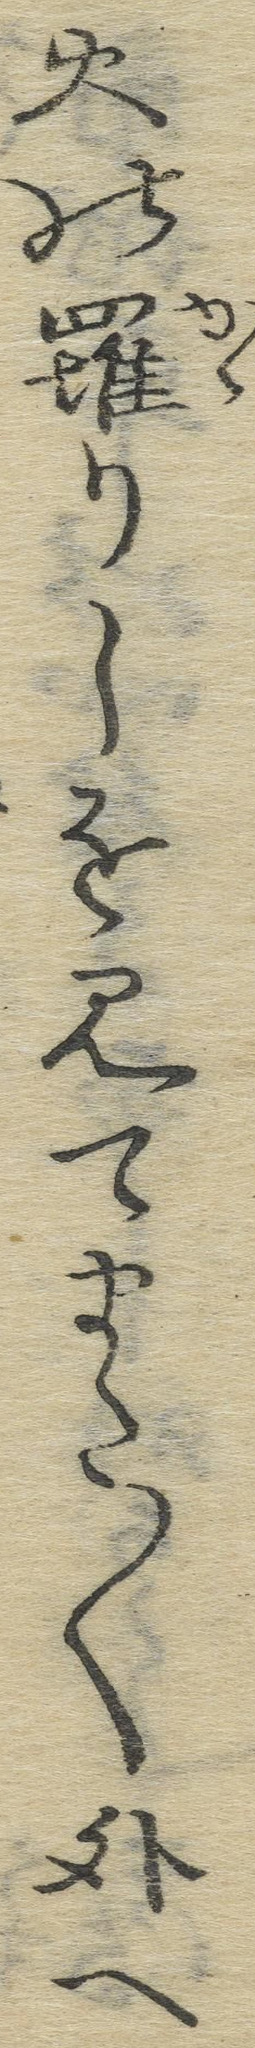火の罹りしを見てまた〳〵外へ
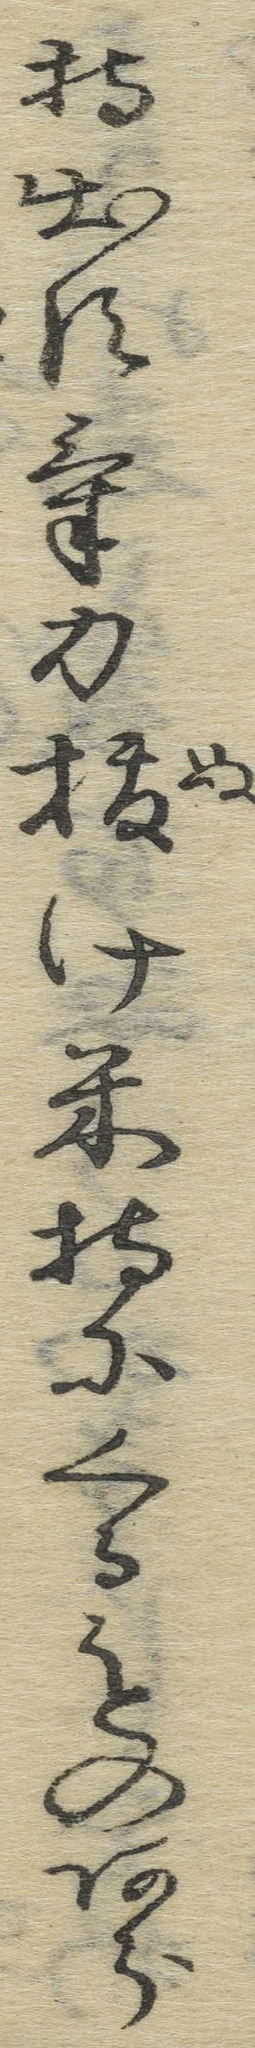持出す気力抜け米持にくるものあら
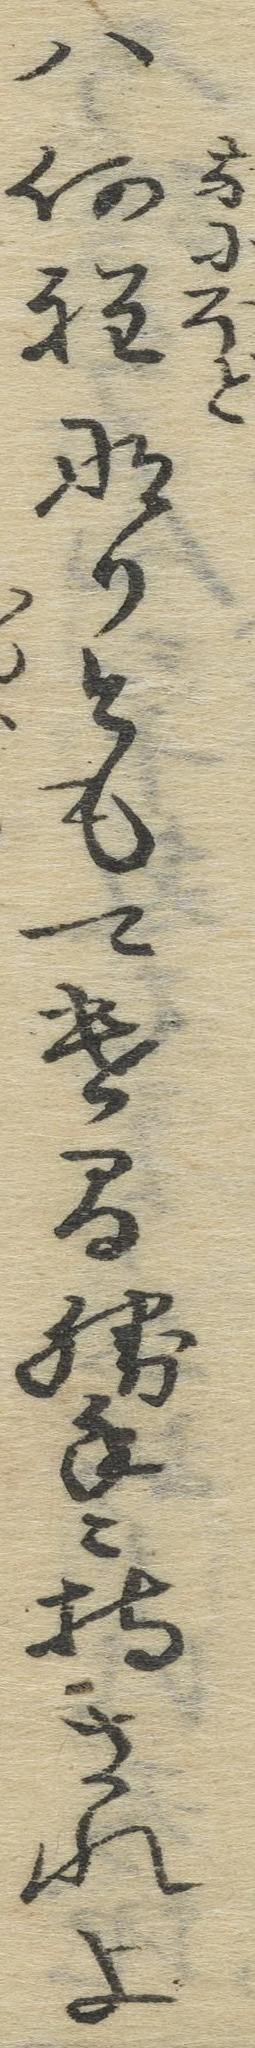は何程なりともて遣間勝手に持されよ
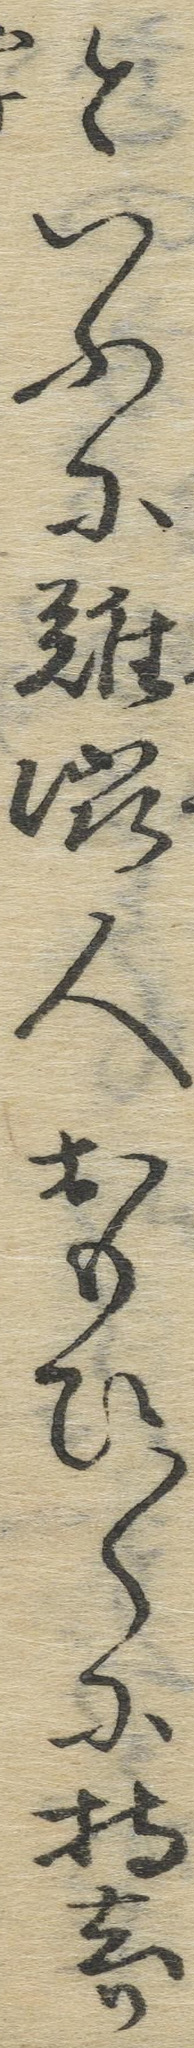といふに難渋人おもひ〳〵に持去り
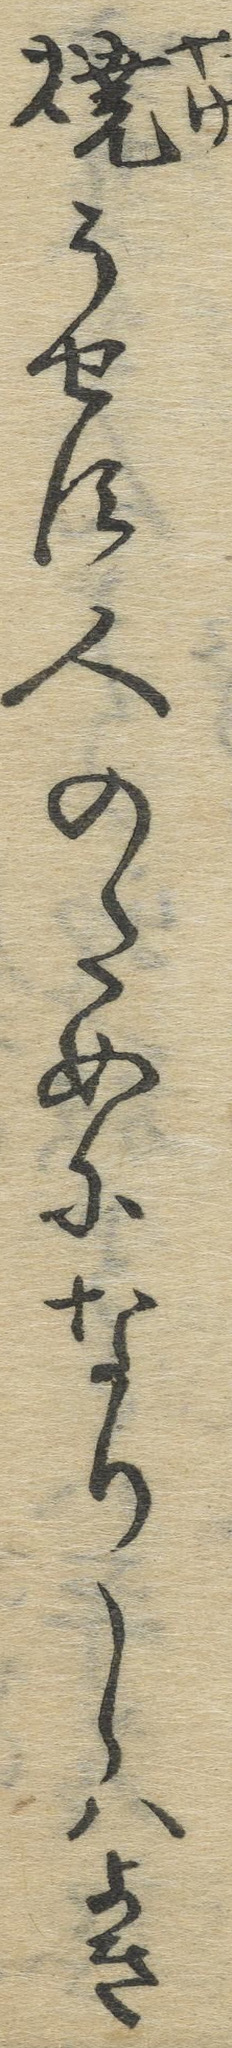焼うせす人のためになりしはよき
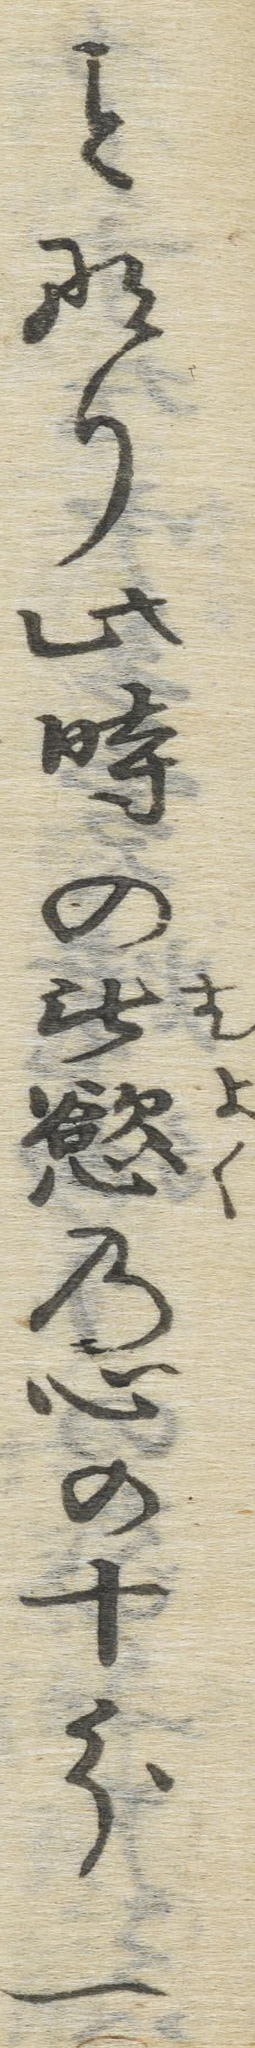ことなり此時の無欲の心の十分一
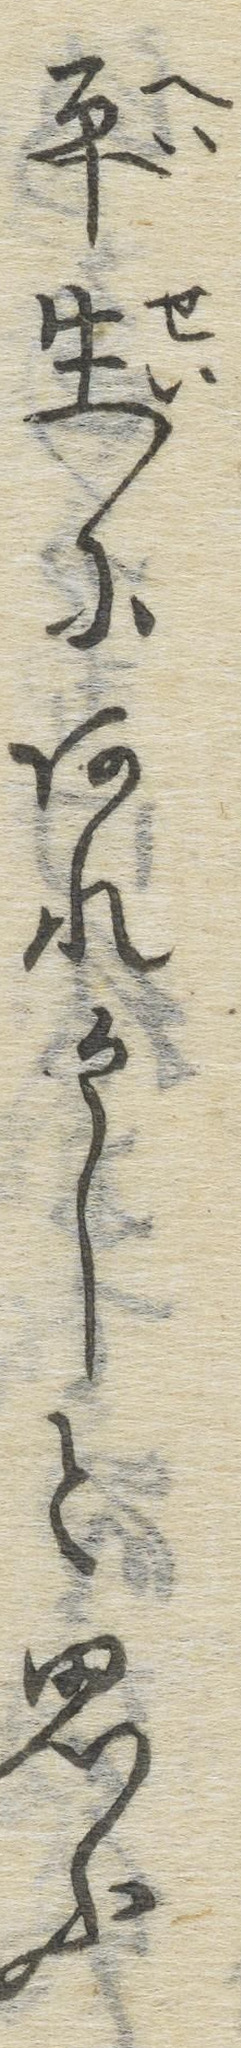平生にあれかしと思ふ
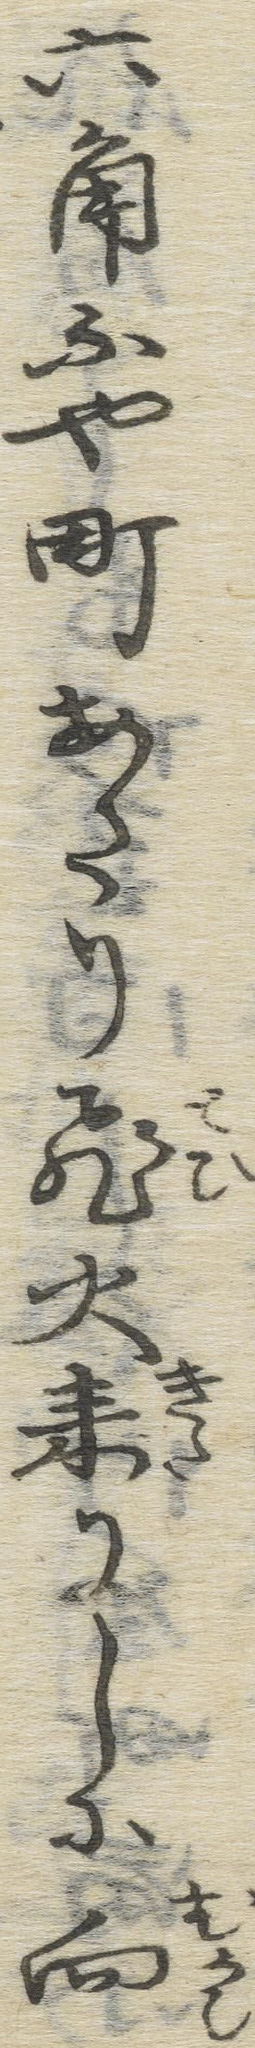六角ふや町あたり飛火来りしに向
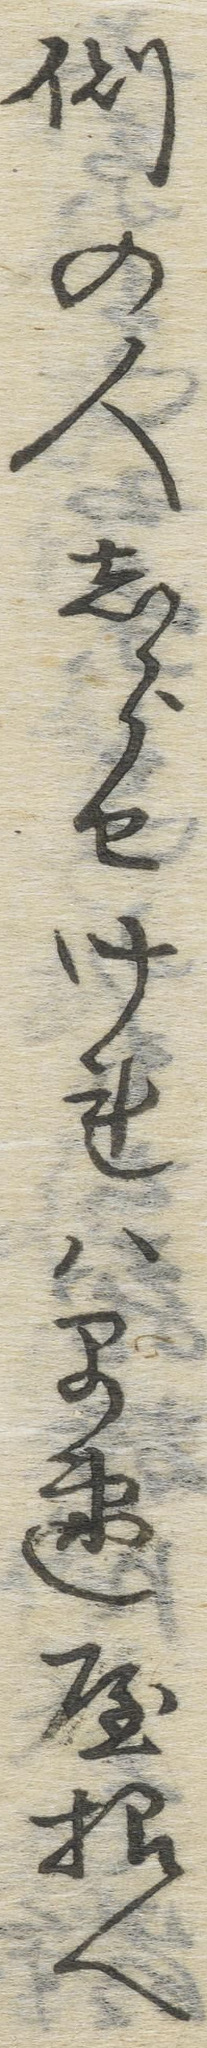側の人しらせけれは早速屋根へ
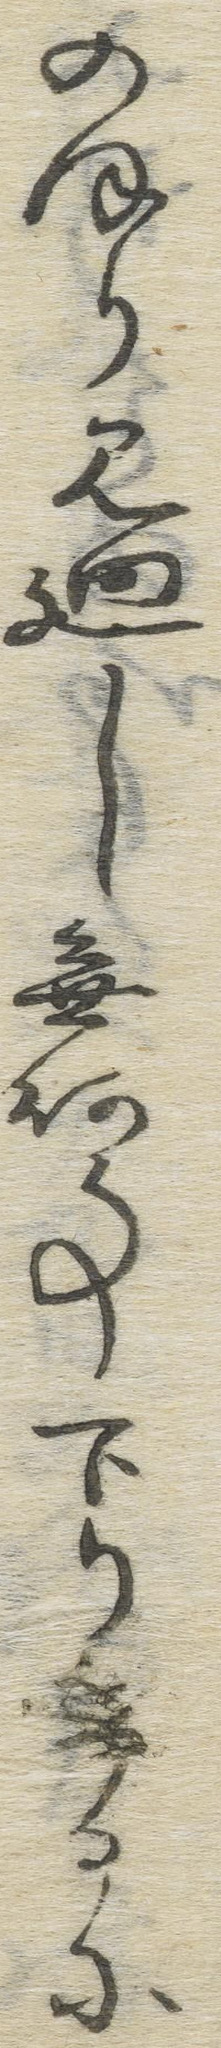のほり見廻し無何事下りけるに
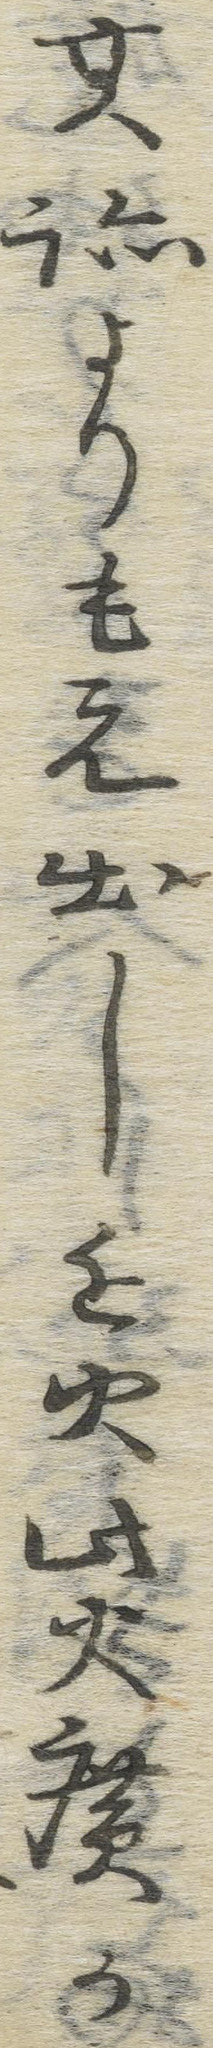其跡よりもえ出し近火此火廣か
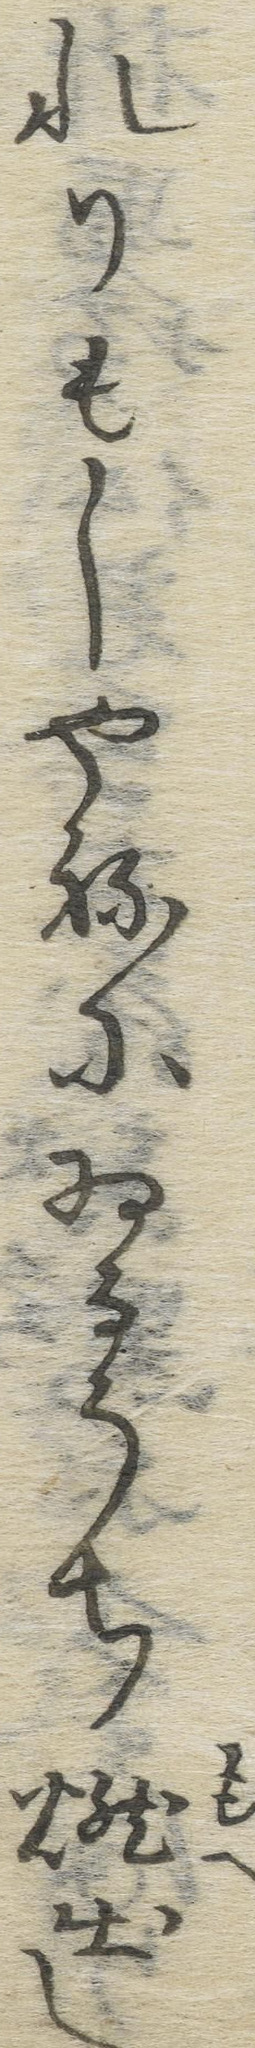れりもしやねにゐるうち燃出し
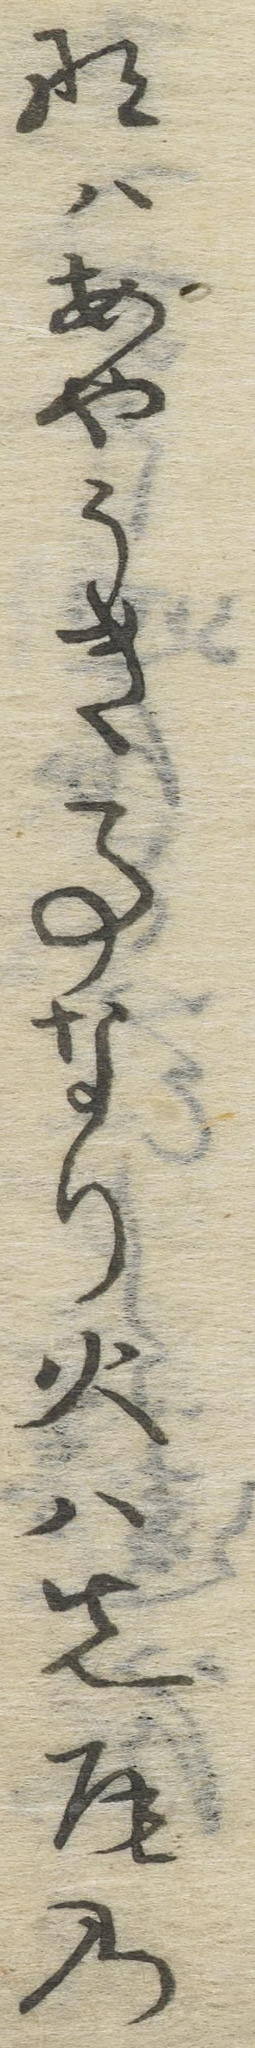なはあやうき事なり火は先瓦の

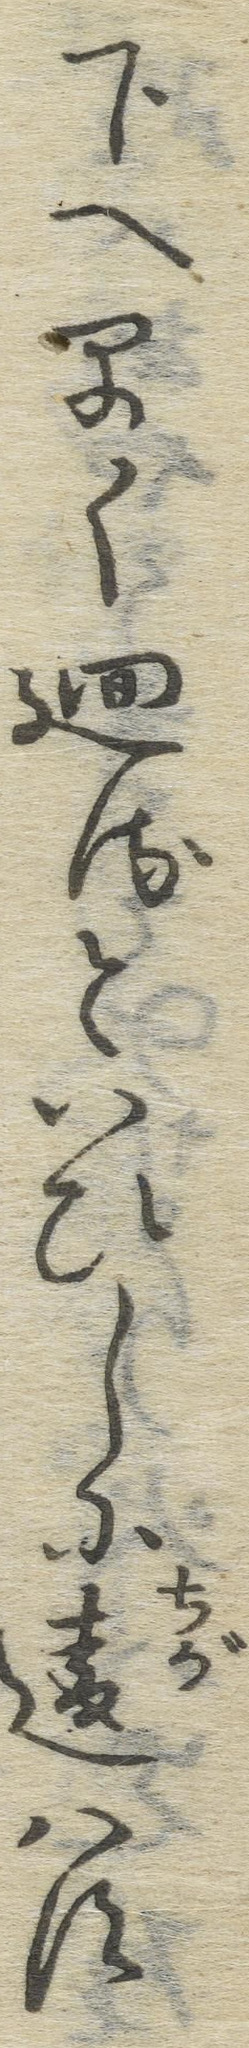下へ写し廻るといひしに違はす
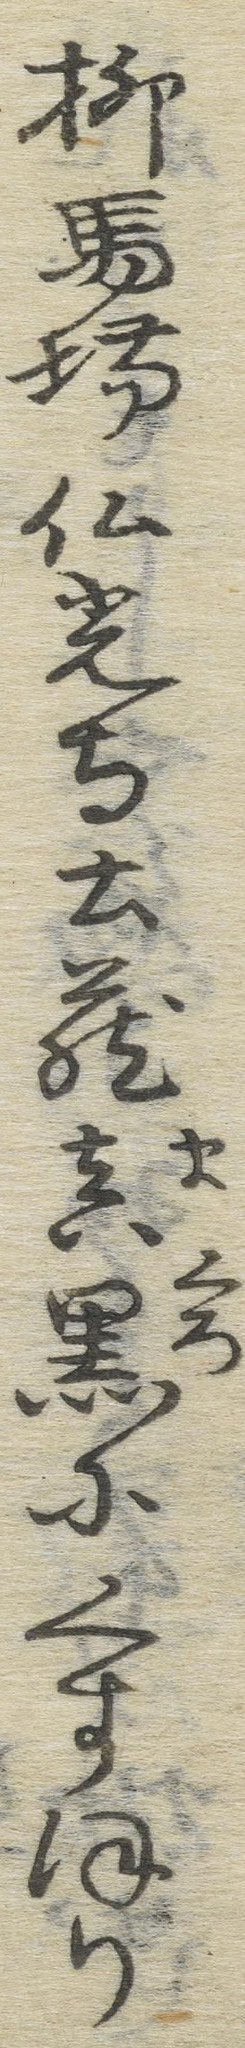柳馬場仏光寺土蔵真黒にくすほり
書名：あきの日照
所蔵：東京大学地震研究所図書室 Earthquake Research Institute Library, The University of Tokyo, JAPAN
